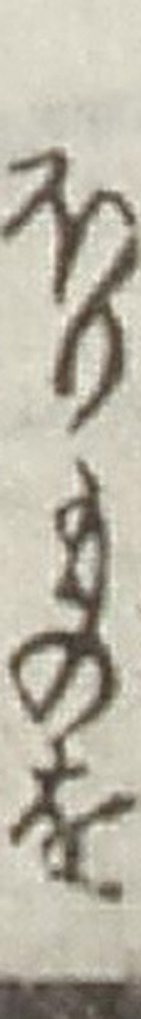ほりものを
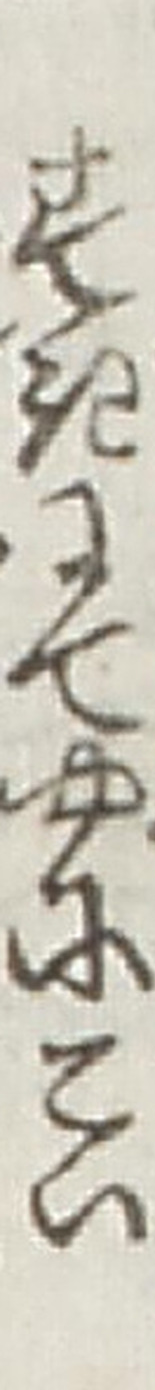すきにてやにこい
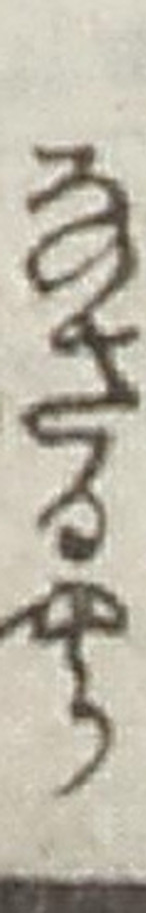なさるやう
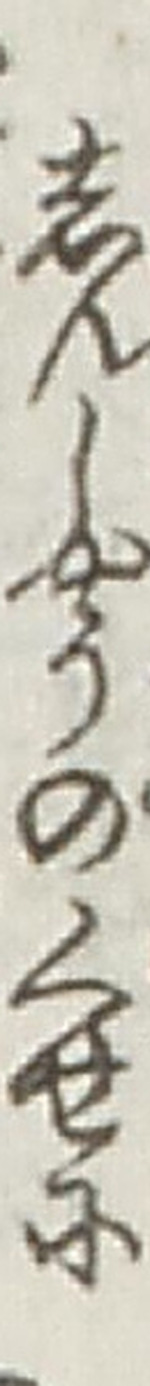しんしやうのくせに
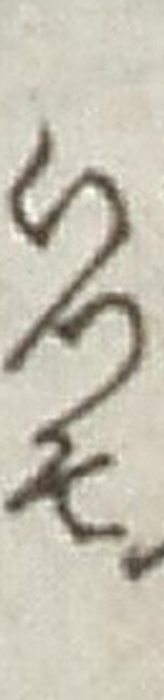いつそ
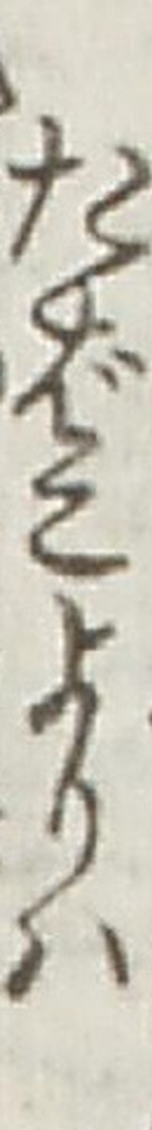たばこよりは
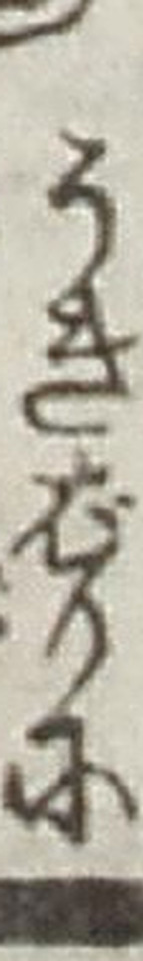うきばりに
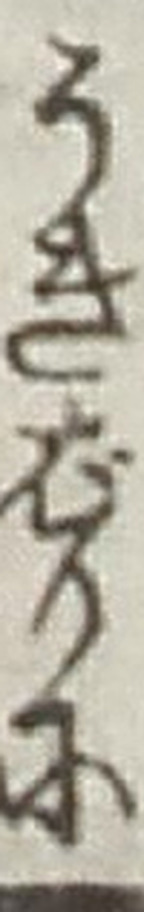うきばりに
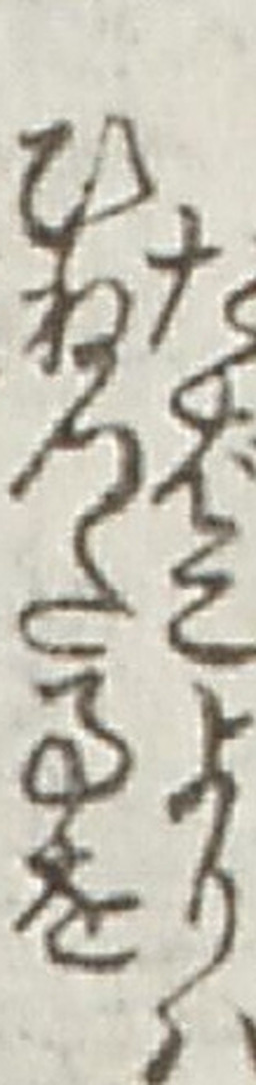ひねつた事を
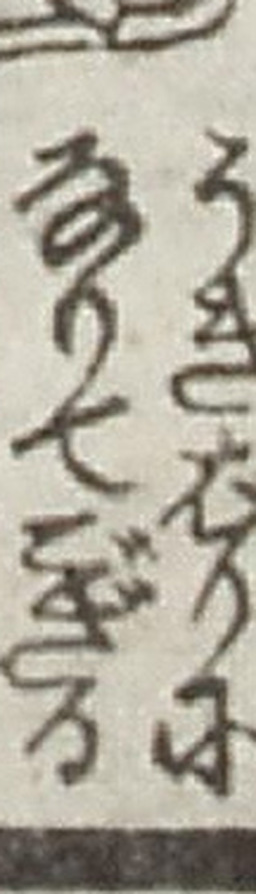なりてござる
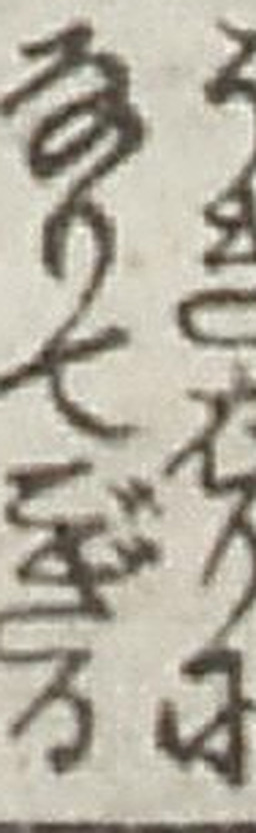なりてござる
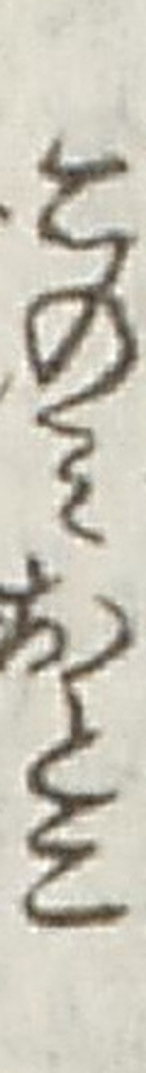このみおとこ
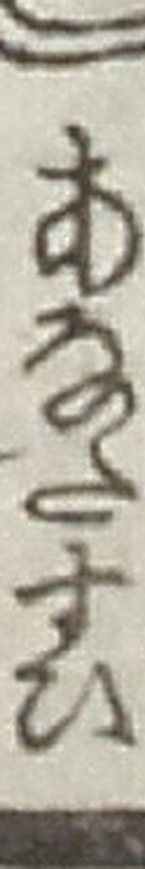あなたすひ
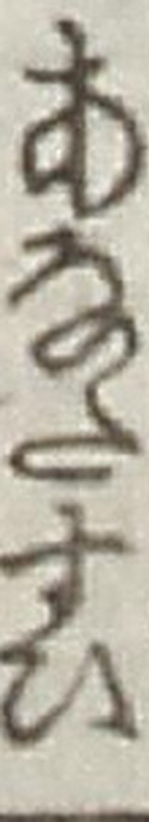あなたすひ
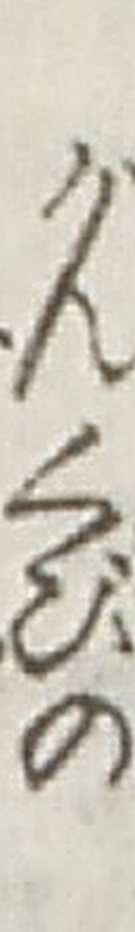がんくびの
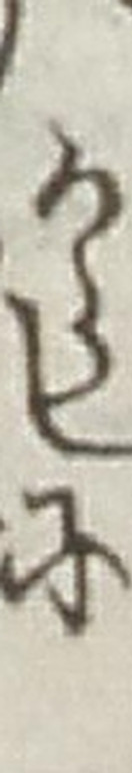からしに
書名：三世相出雲當座帳　上下冊
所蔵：東京大学地震研究所図書室 Earthquake Research Institute Library, The University of Tokyo, JAPAN
